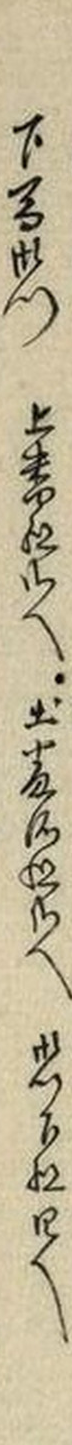下馬御門上番組弐人出番所組弐人御門下組四人
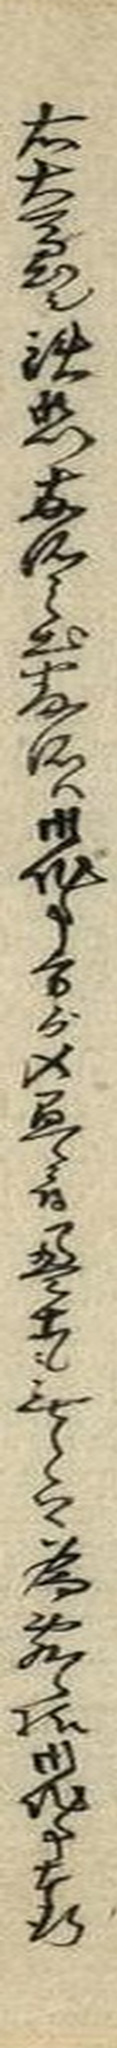右大馬出シ鉄御門両所之出番所ハ御作事方ゟ〆置候ニ付畳等も無之候ハヽ為敷候様御作事奉行
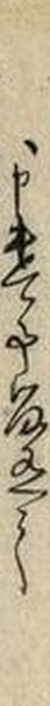へ申遣候事留有之
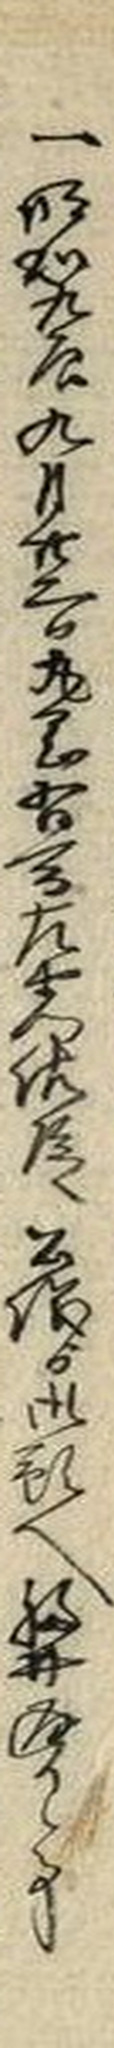一明和九辰九月廿二日丸岡有馬左衛門佐殿へ公儀ゟ御預人福井通り候事
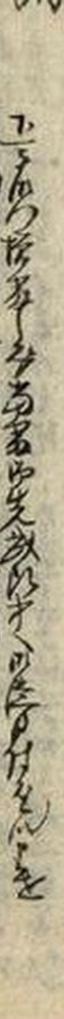下馬御門増番之義当番御先武頭共へ御徒目付を以申遣
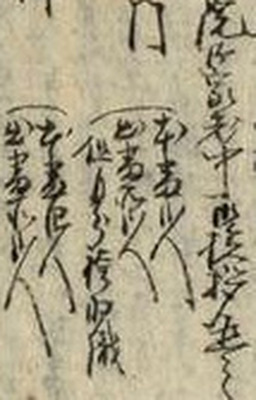出番所弐人
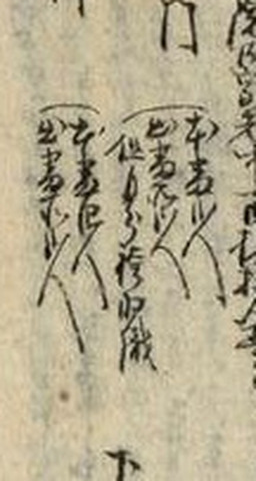但自分袴羽織
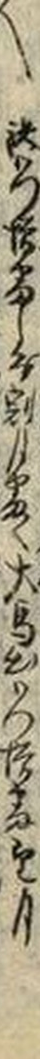鉄御門増番之義割月番へ大馬出御門増番望月
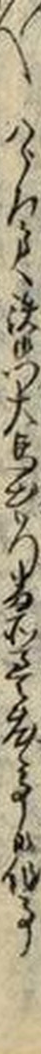八郎右衛門方へ鉄御門大馬出御門番所畳敷候事御作事
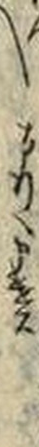奉行へ申遣ス
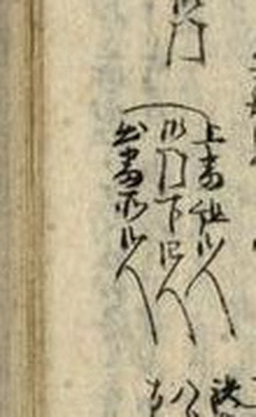出番所弐人

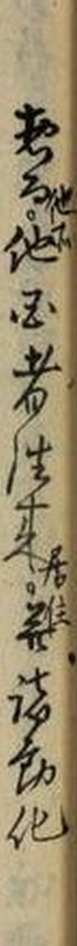惣而他所他国者往来居住幷諸勧化
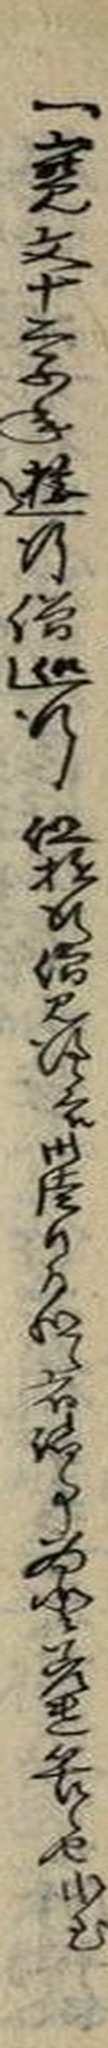一寛文十二子年遊行僧巡行但遊行僧見得候節御徒目付組之者諸事為承ニ差遣筈之由小玉
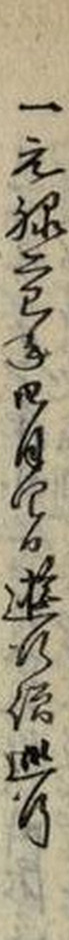一元禄二巳年四月四日遊行僧巡行
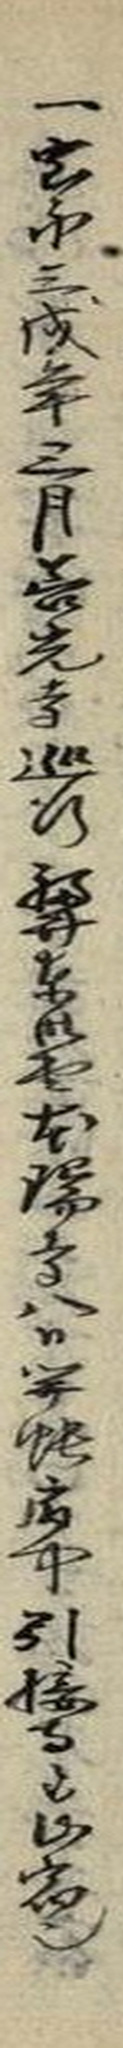一宝永三戌年三月善光寺巡行福井東御堂本瑞寺八日開帳府中引接寺ニも止宿也
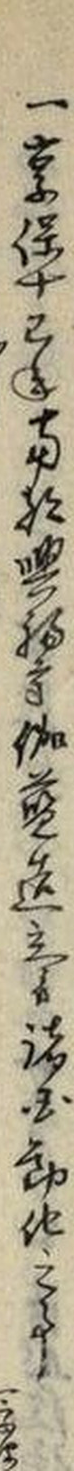一享保十巳年南都興福寺伽藍造立ニ付諸国勧化之事
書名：御国他国諸事之部
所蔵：福井県文書館 Fukui Prefectural Archives
